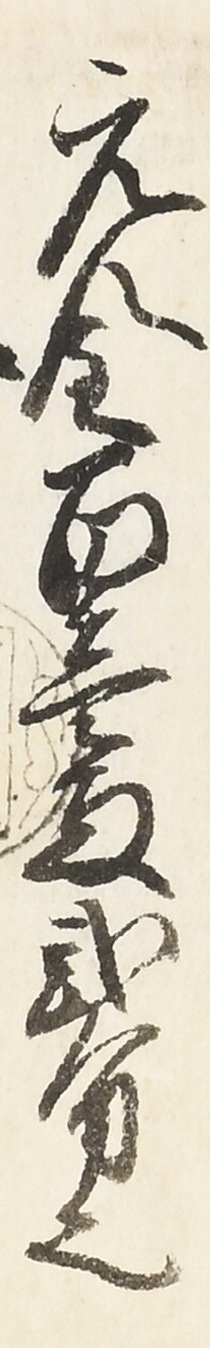元金百壱両弐分也
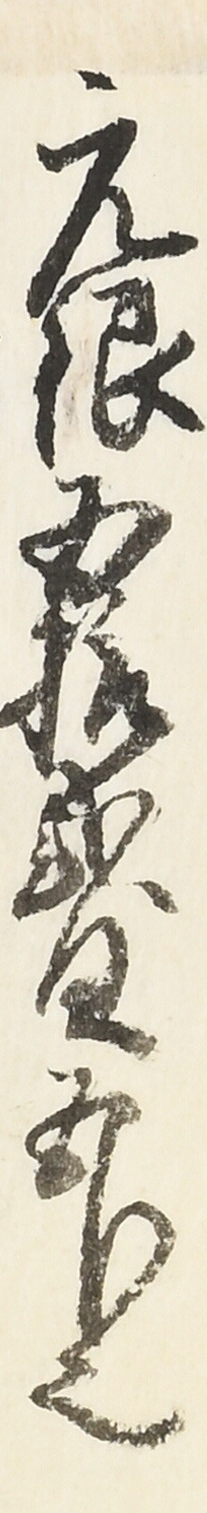元銀五拾弐匁五分也
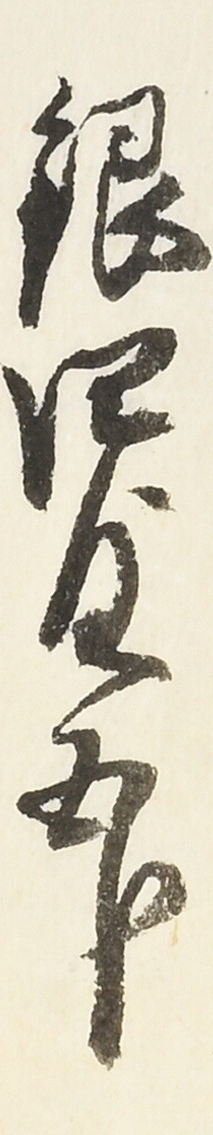銀四匁五分
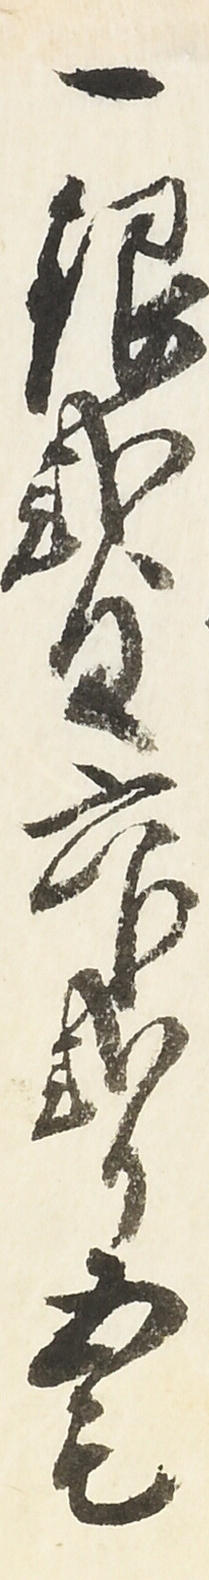一銀弐匁六分弐厘五毛
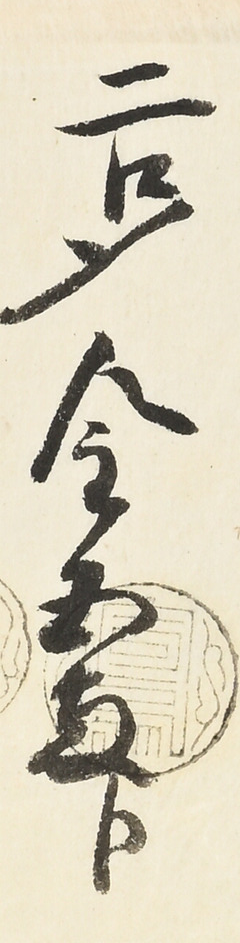二口〆金五両ト
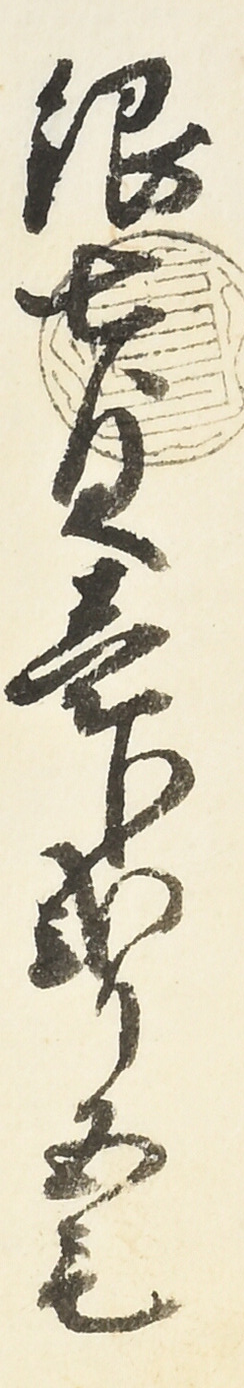銀七匁壱分弐厘五毛
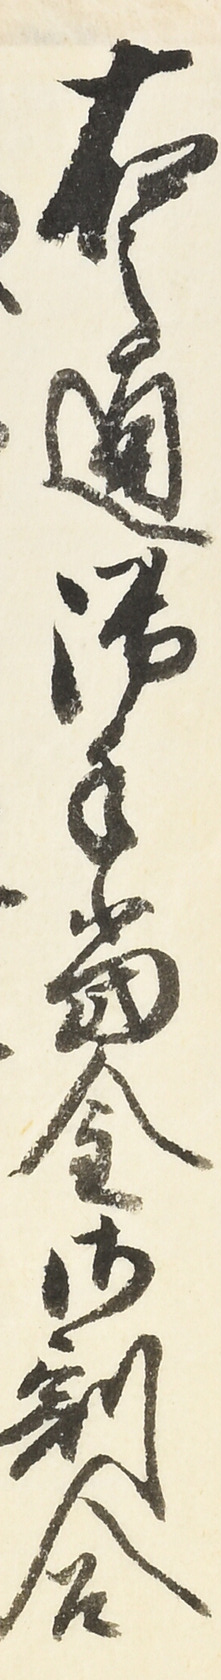右之通御手当金御割合
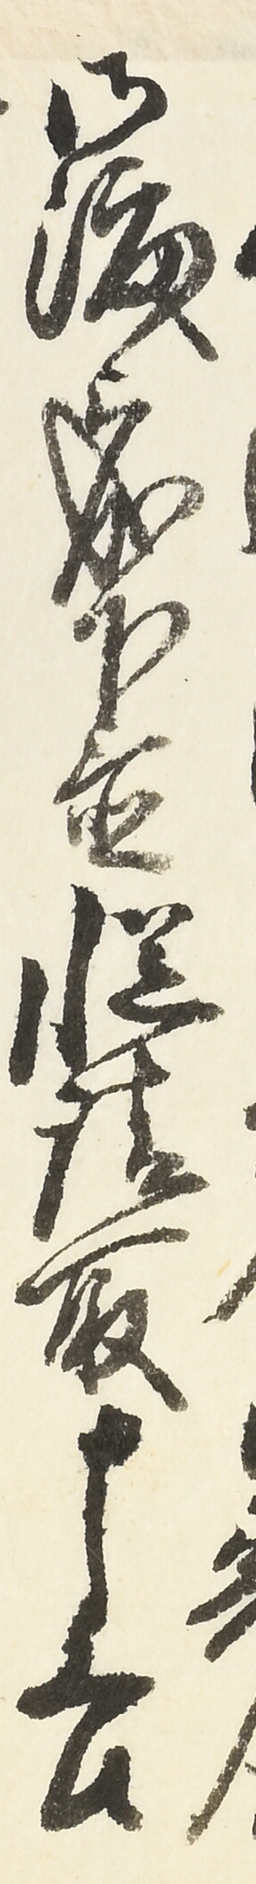御渡被成下置慥請取申上候
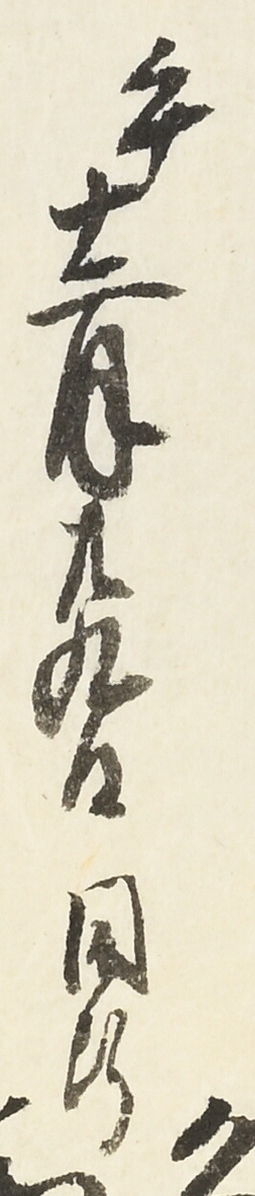午十二月廿九日同断
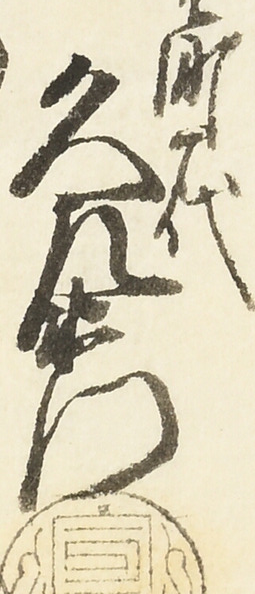久左衛門
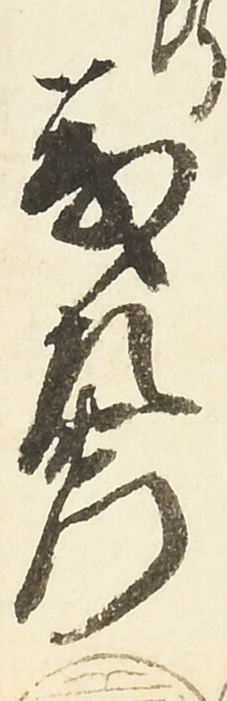久左衛門

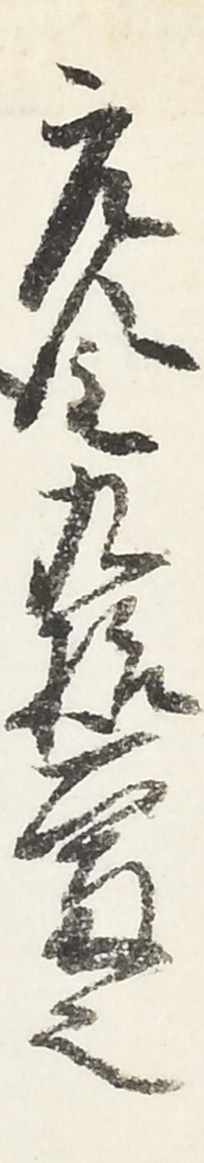元金九拾六両也
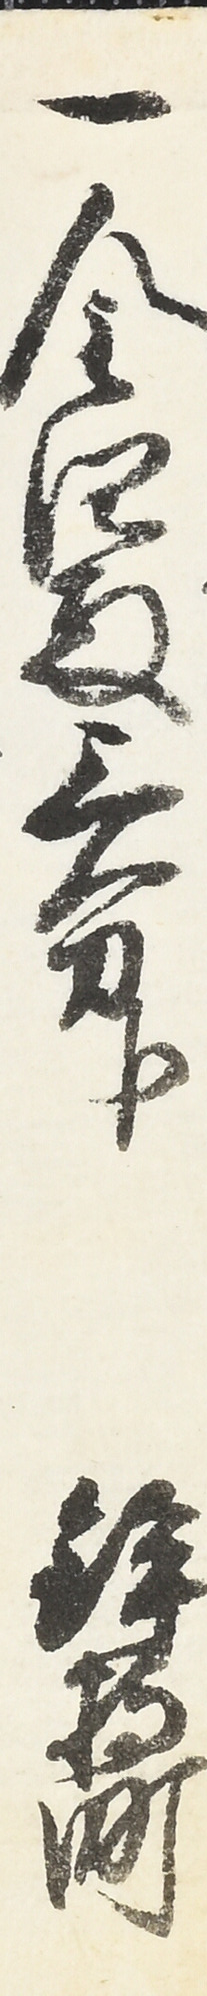一金四両三分ト錺持町
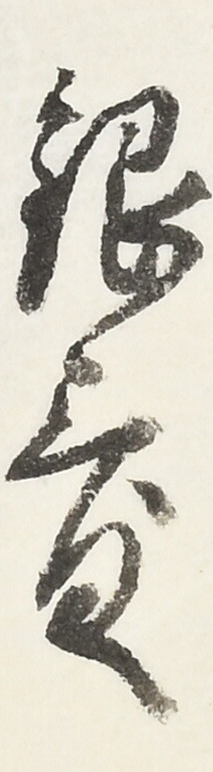銀三匁
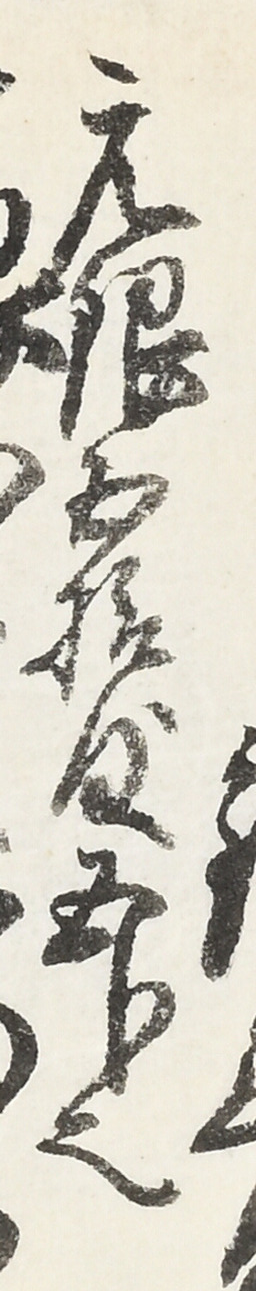元銀五拾匁五分也
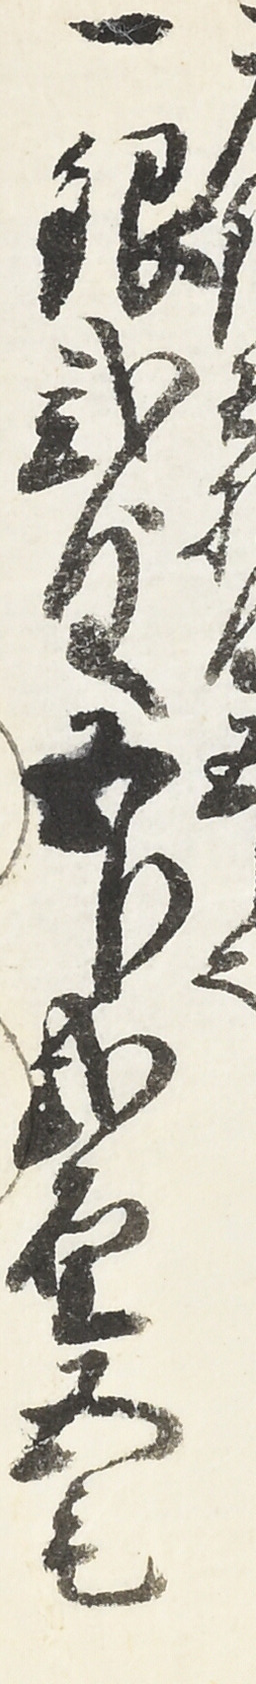一銀弐匁五分弐厘五毛
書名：御才覚金御利足割渡扣帳
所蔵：伊那市立高遠町図書館・合同会社AMANE
